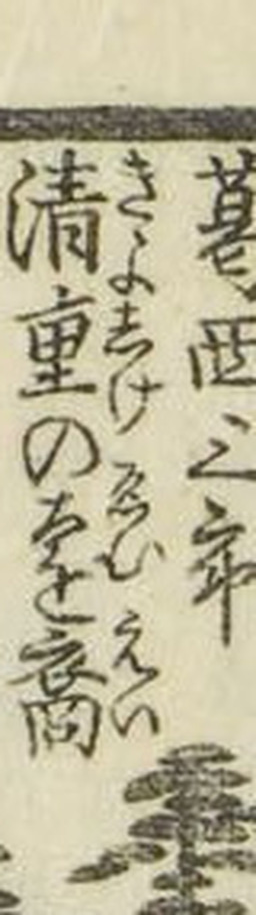清重の遠裔
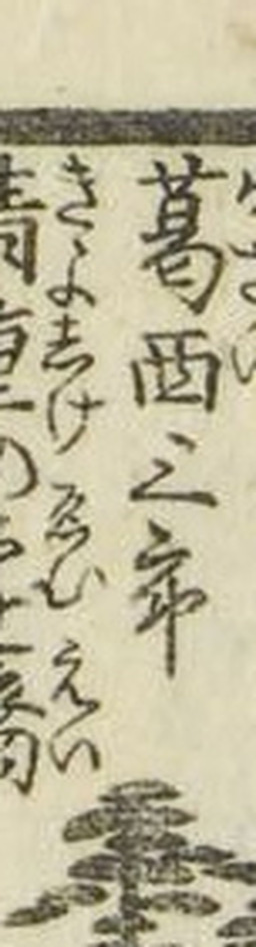清重の遠裔
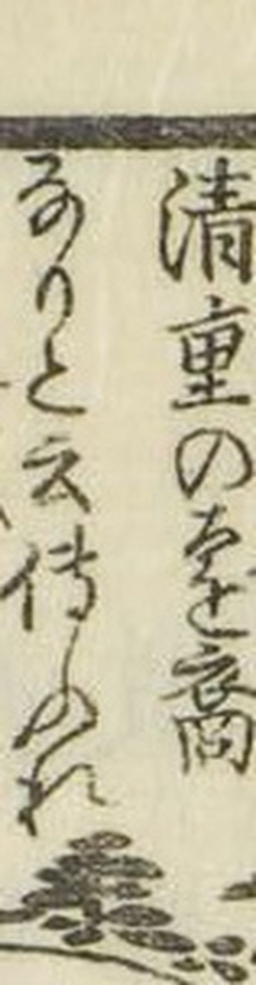なりと云伝ふれ
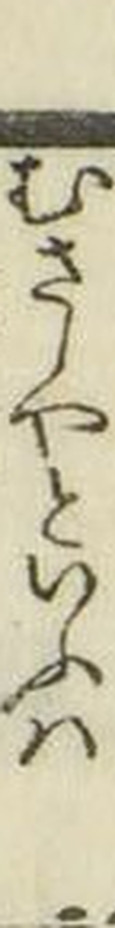むさしやといふは
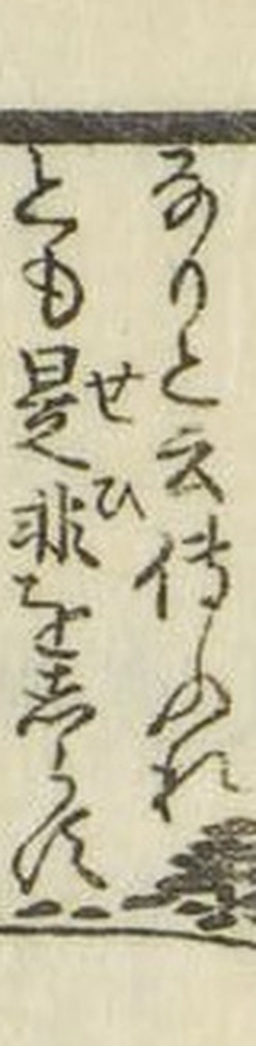とも是非をしらす
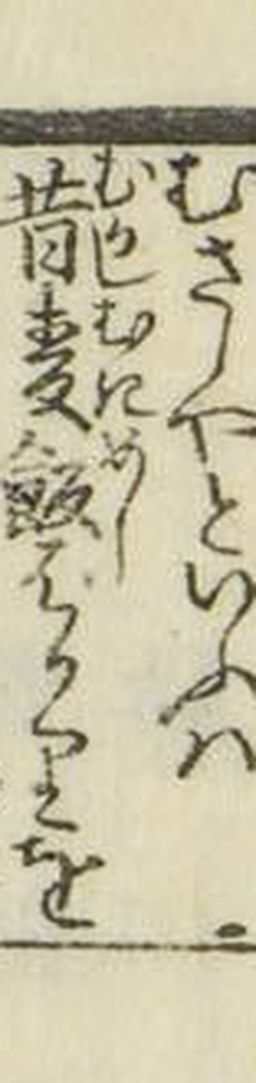昔麦飯はかりを
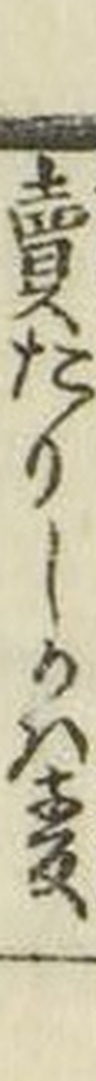売たりしかは麦
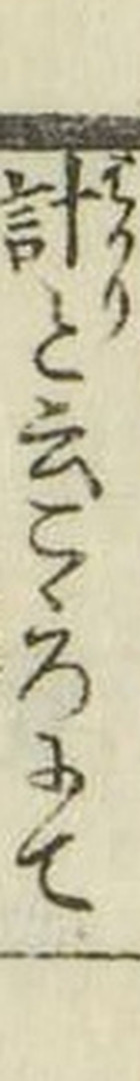計と云こゝろにて
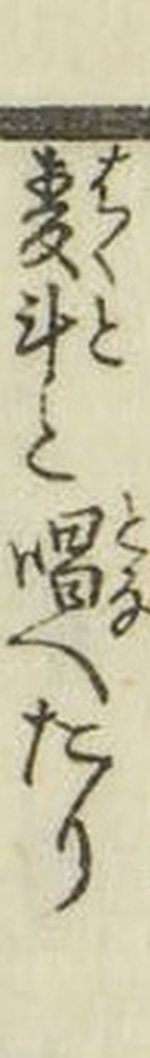麦斗と唱へたり
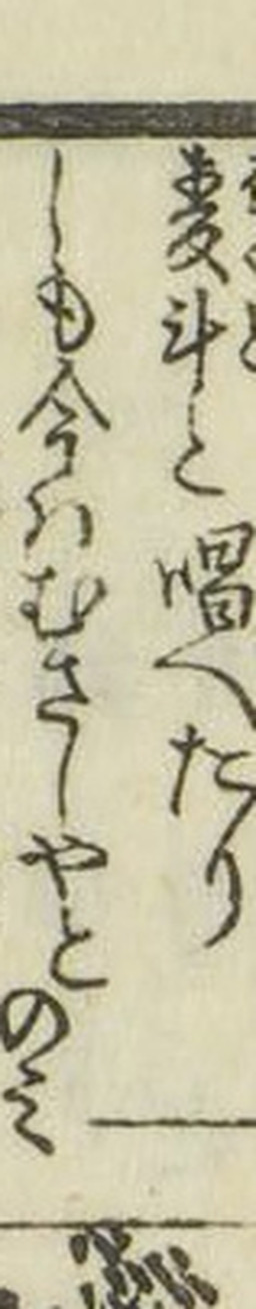しも今はむさしやとのみ
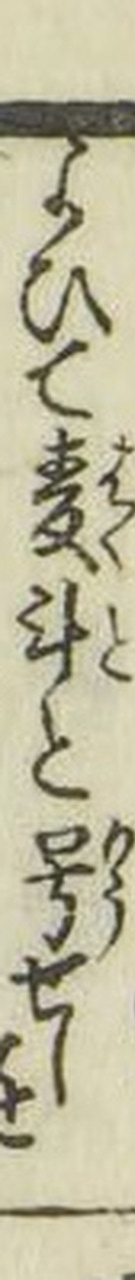よひて麦斗と号せしを
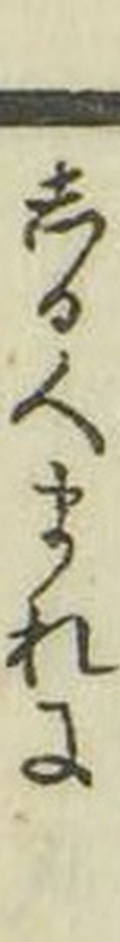しる人まれに
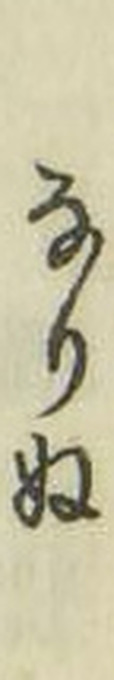なりぬ

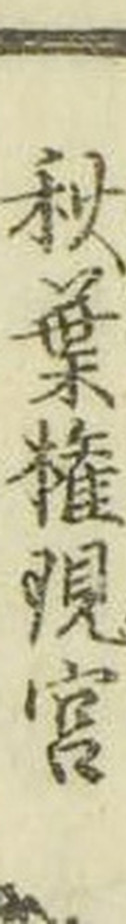秋葉権現宮
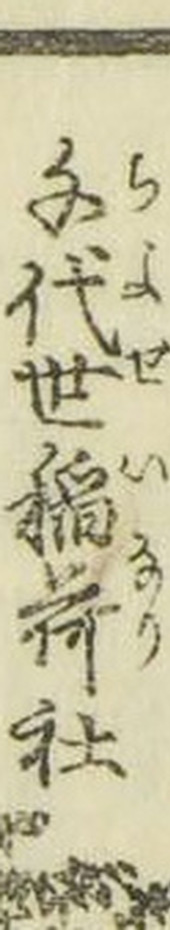千代世稲荷社
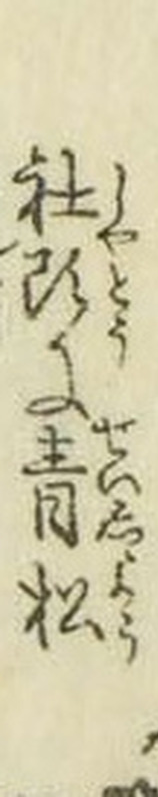社頭に青松
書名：江戸名所図会 20巻 巻之19
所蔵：東京学芸大学教育コンテンツアーカイブ
